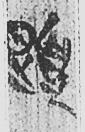{日止頁}
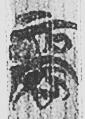商
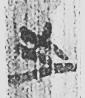之
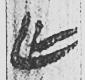亡
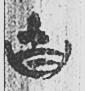由
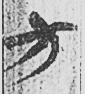方
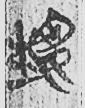埶
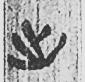出
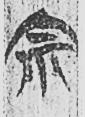宗
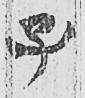子
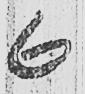㠯（以）
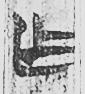乍
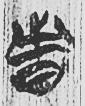周
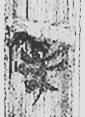厚
